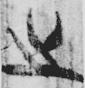之
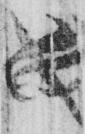民
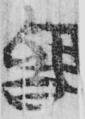○（聞）
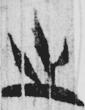之
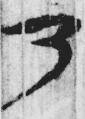乃
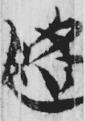降
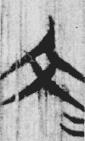文
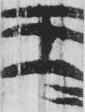王
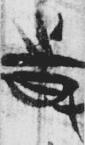時（持）
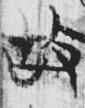故
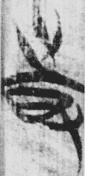時
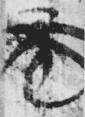而
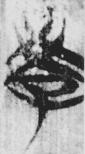○（教）
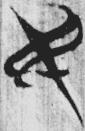民
